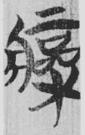○（懆）
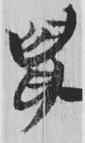鼠
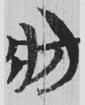○（病）
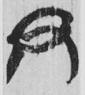尹
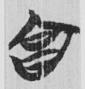○（答）
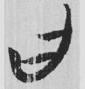曰
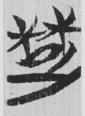楚
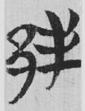邦
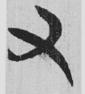又（有）
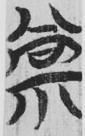○（常）
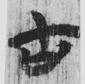古（故）
